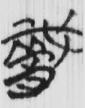戠
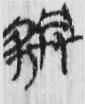豢
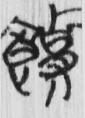饋
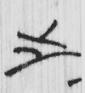之
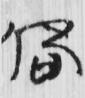卲
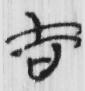吉
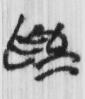爲
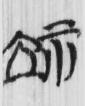○（位）
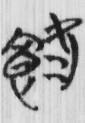既
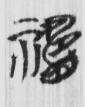禱
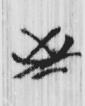至（致）
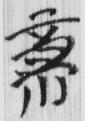福
